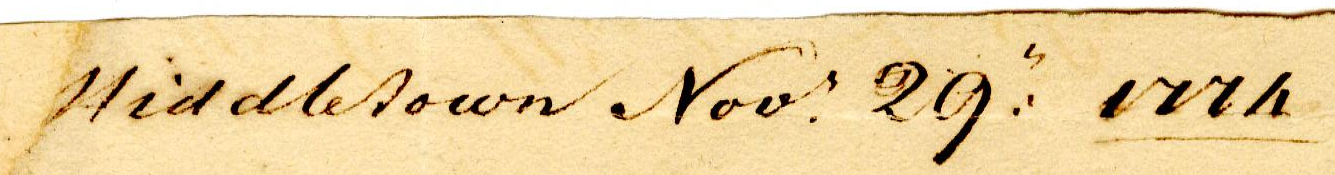Middletown Nov^r. 29^h. 1774
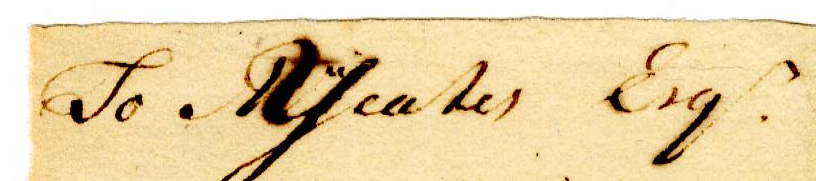To Yeates Esq^r.
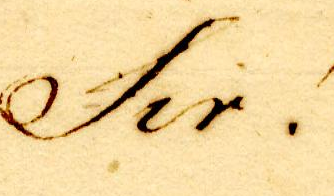Sir!
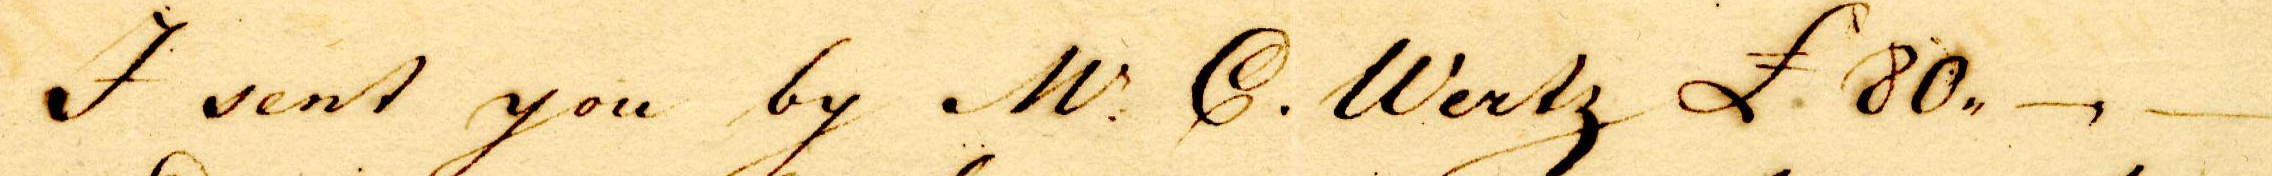I sent you by Mr. C. Wertz £80.
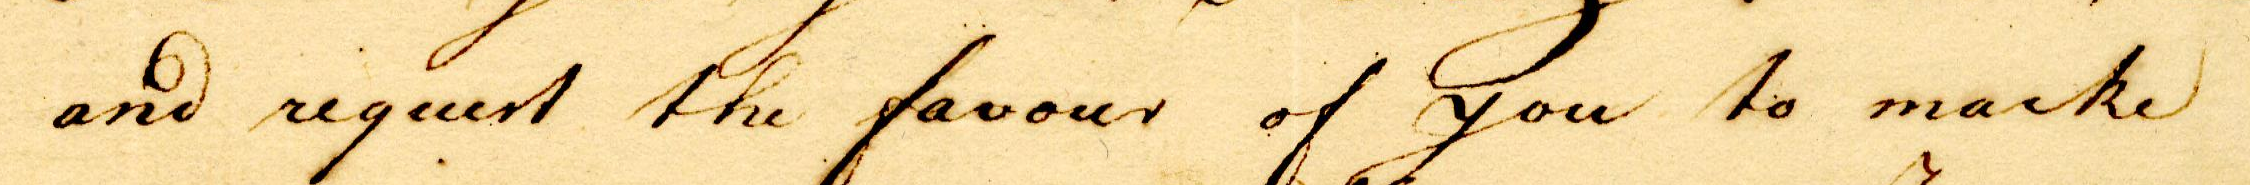and request the favour of you to macke
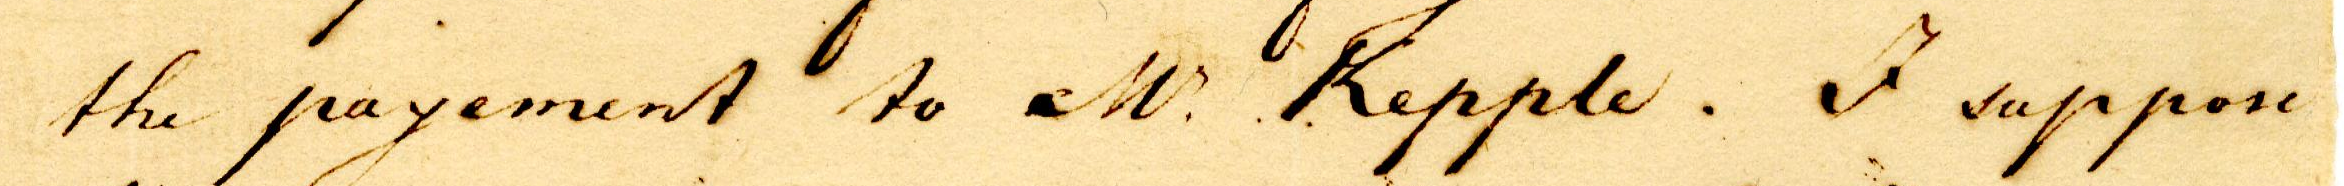the payement to M^r. Kepple. I suppose
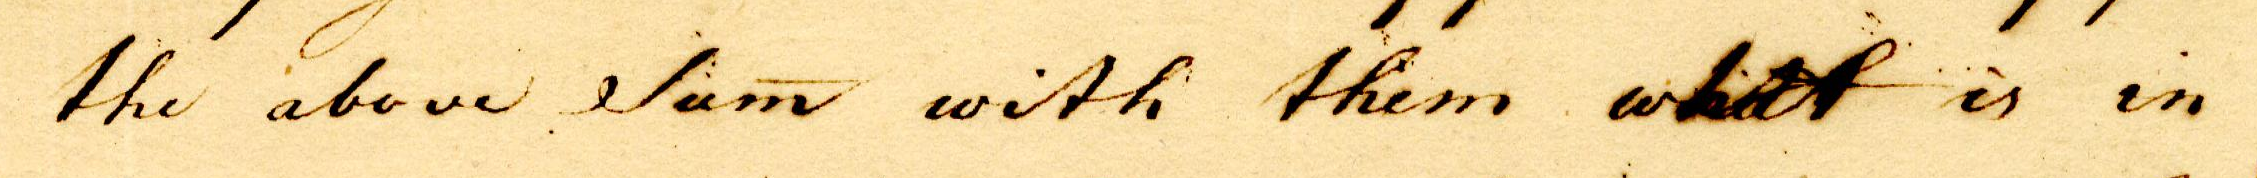the above Sum with them what is in
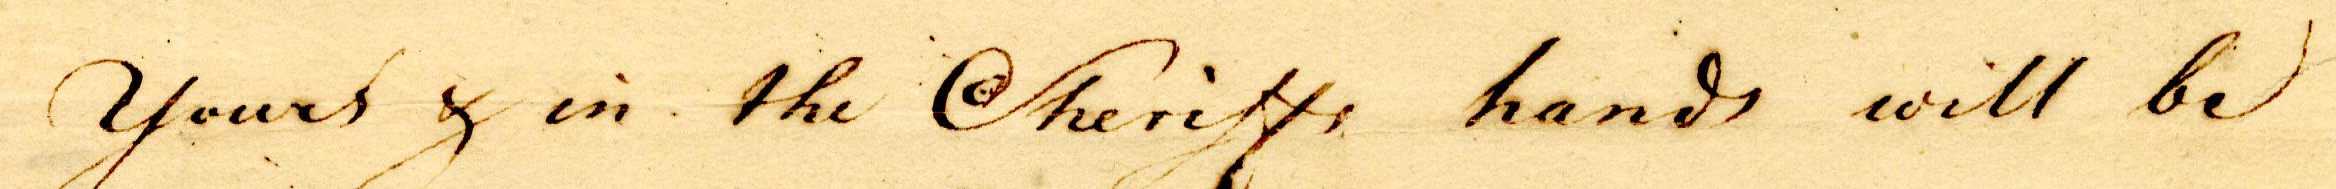Yours & in the Sheriffs hands will be
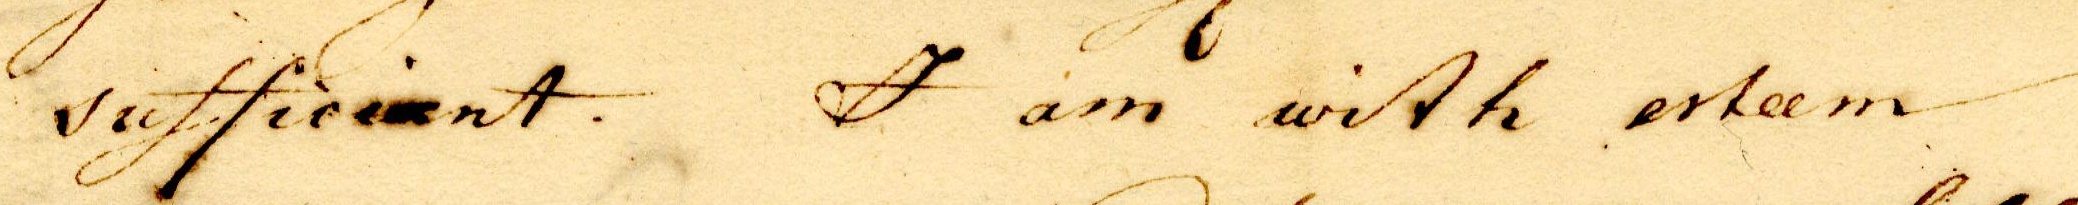sufficient. I am with esteem
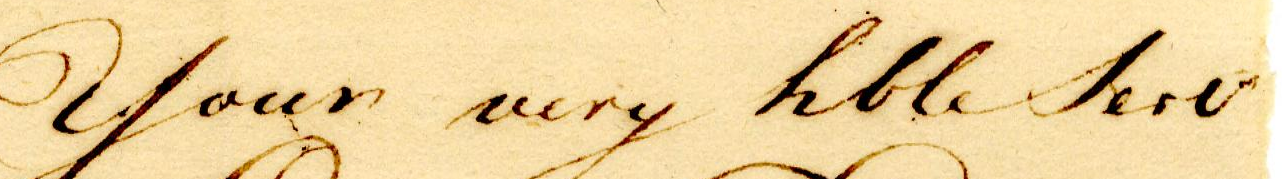Your very hble Serv
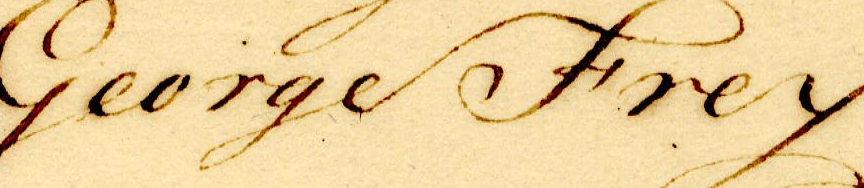George Frey
